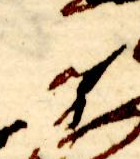of
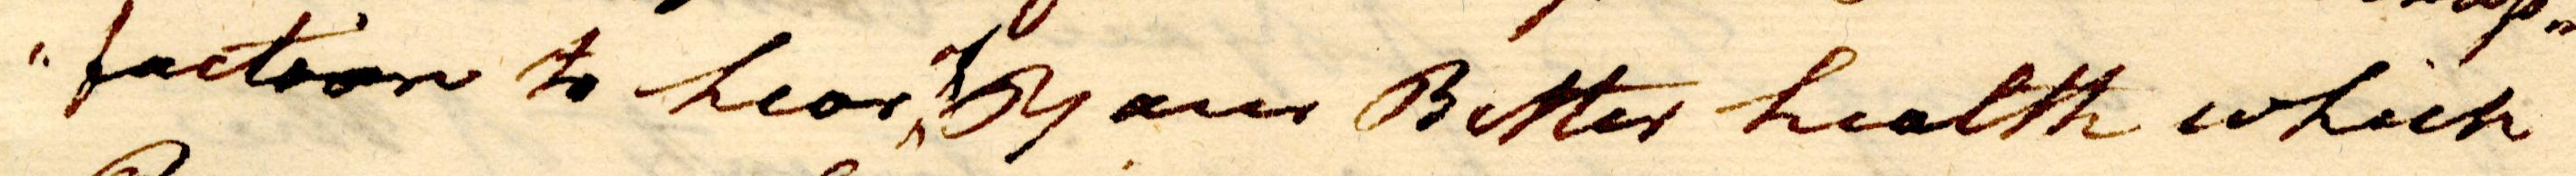-faction to hear ^ your better health which
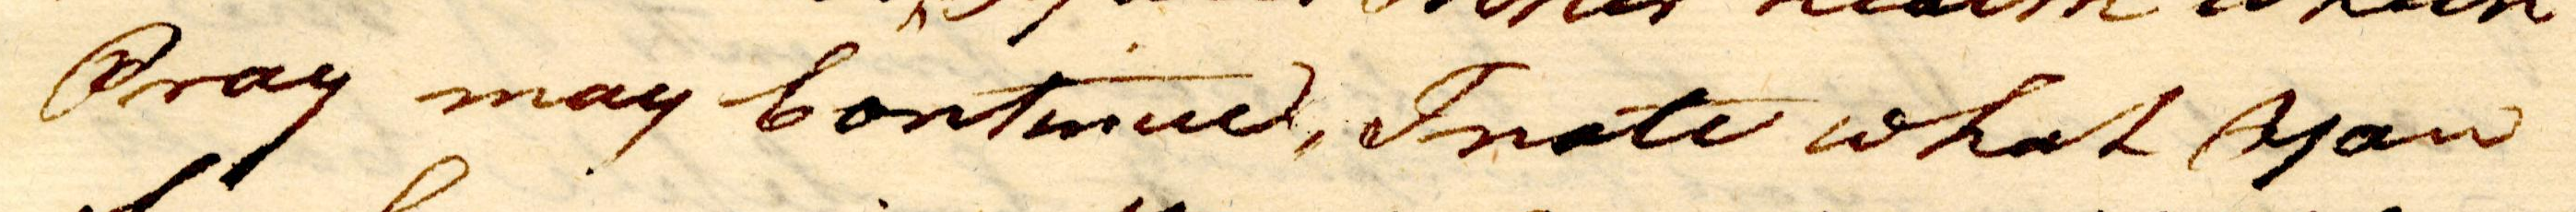pray may continue, I rate what you
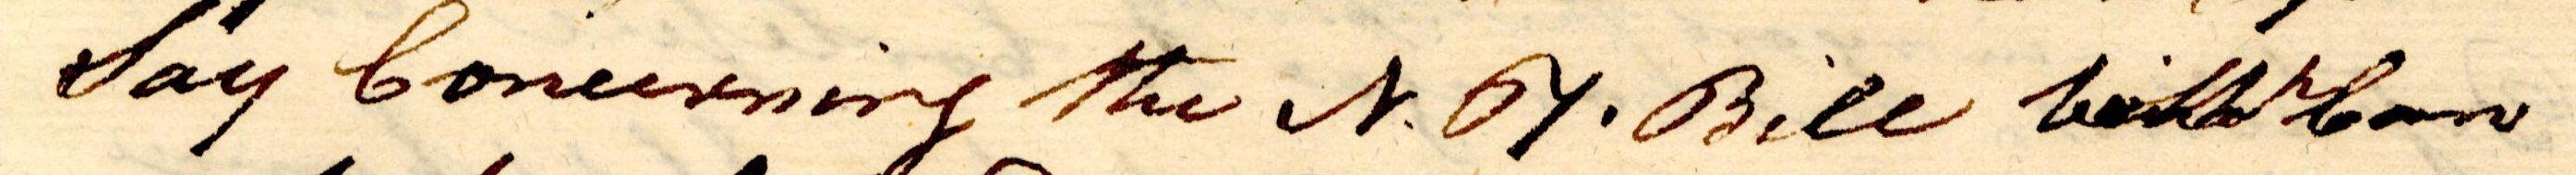say concerning the N.Y. Bill [will] can
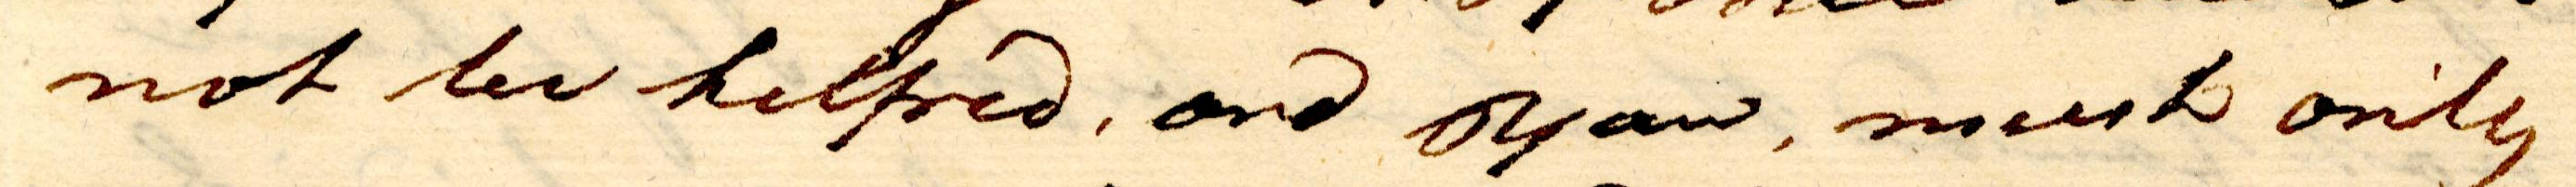not be helped, and you must only
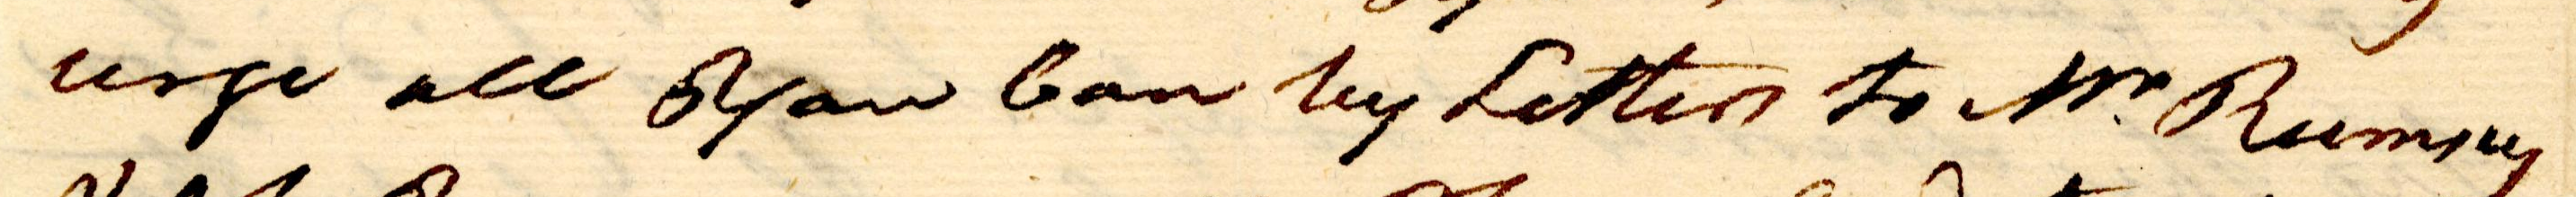urge all you can by letter to M^r. Rumsey
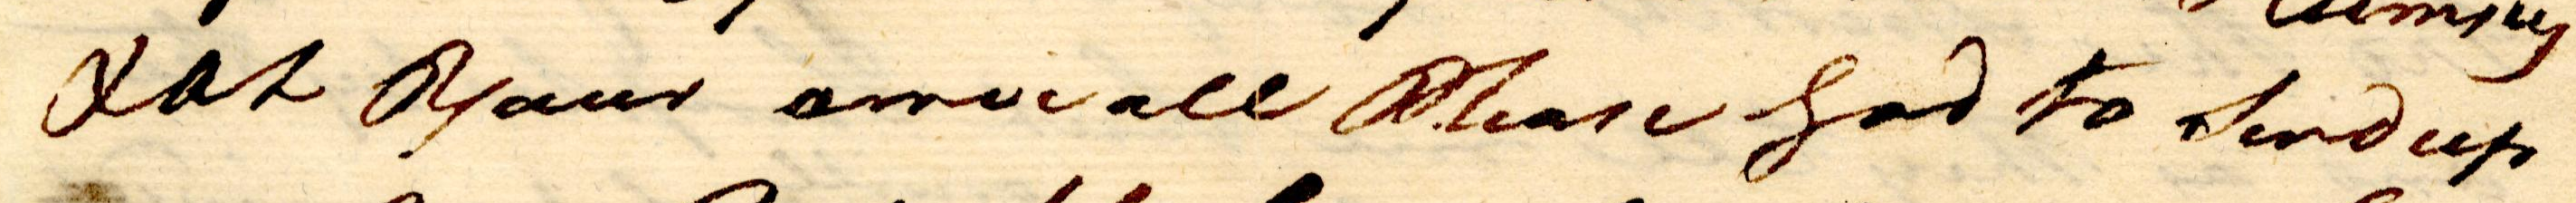& at your arrivall please gard to send up
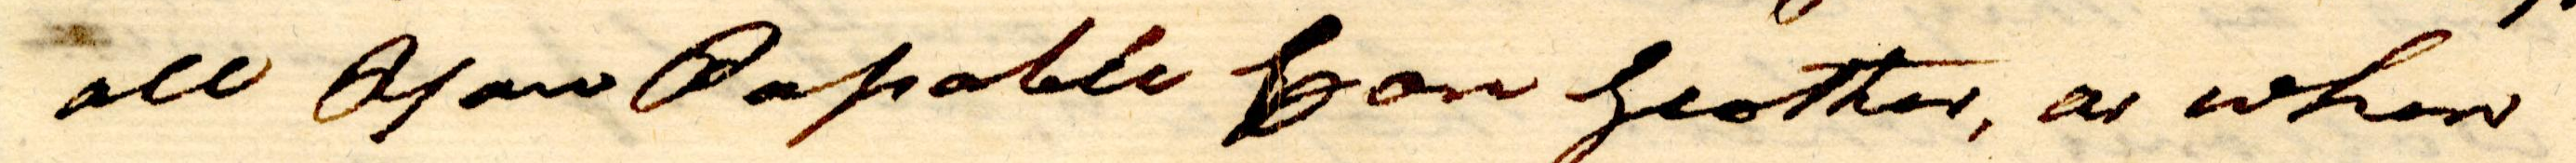all your Capable can Geother, as when
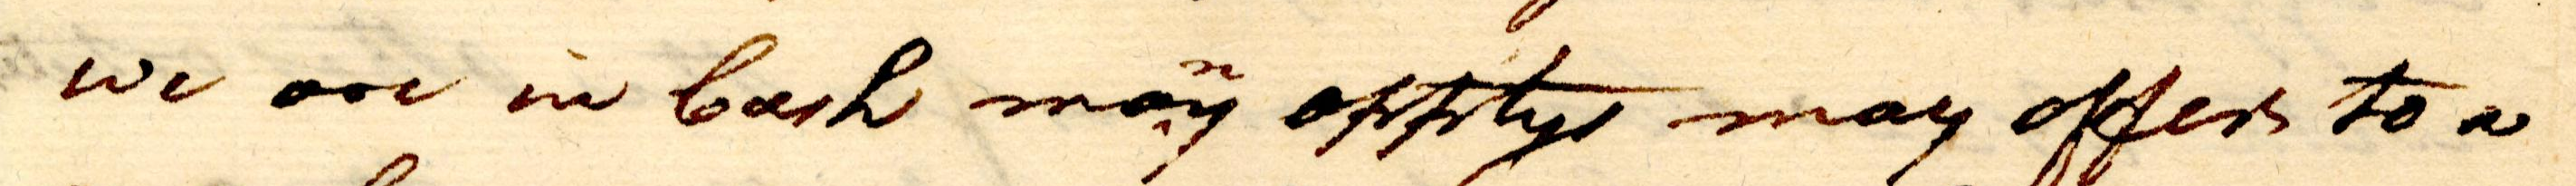we are in Cash ma^ny opptys may offers to a
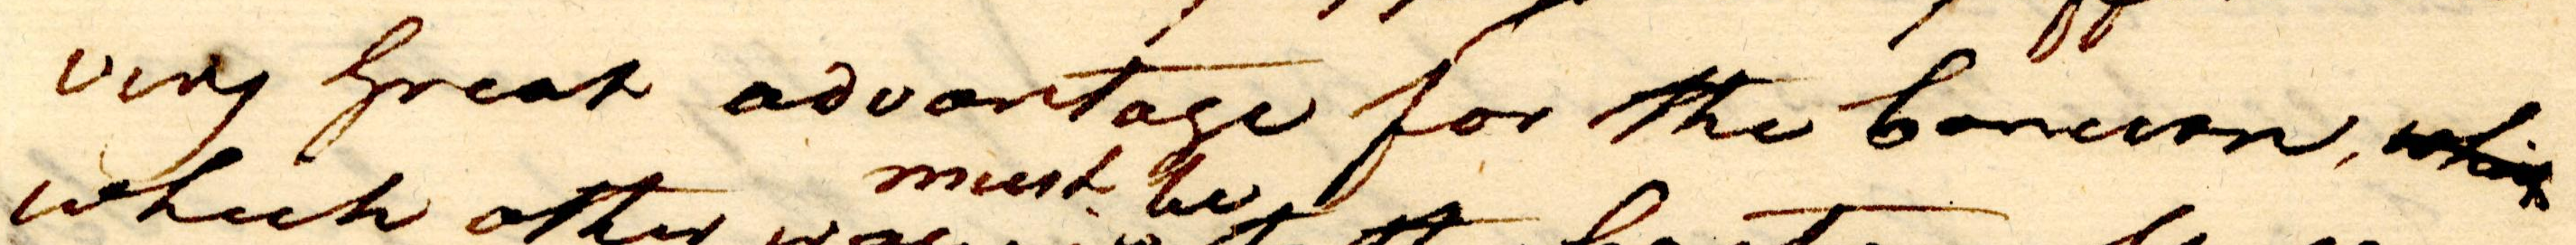very great advantage for the concern, [whi]
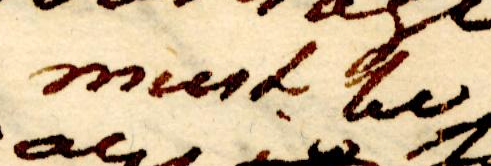must be
